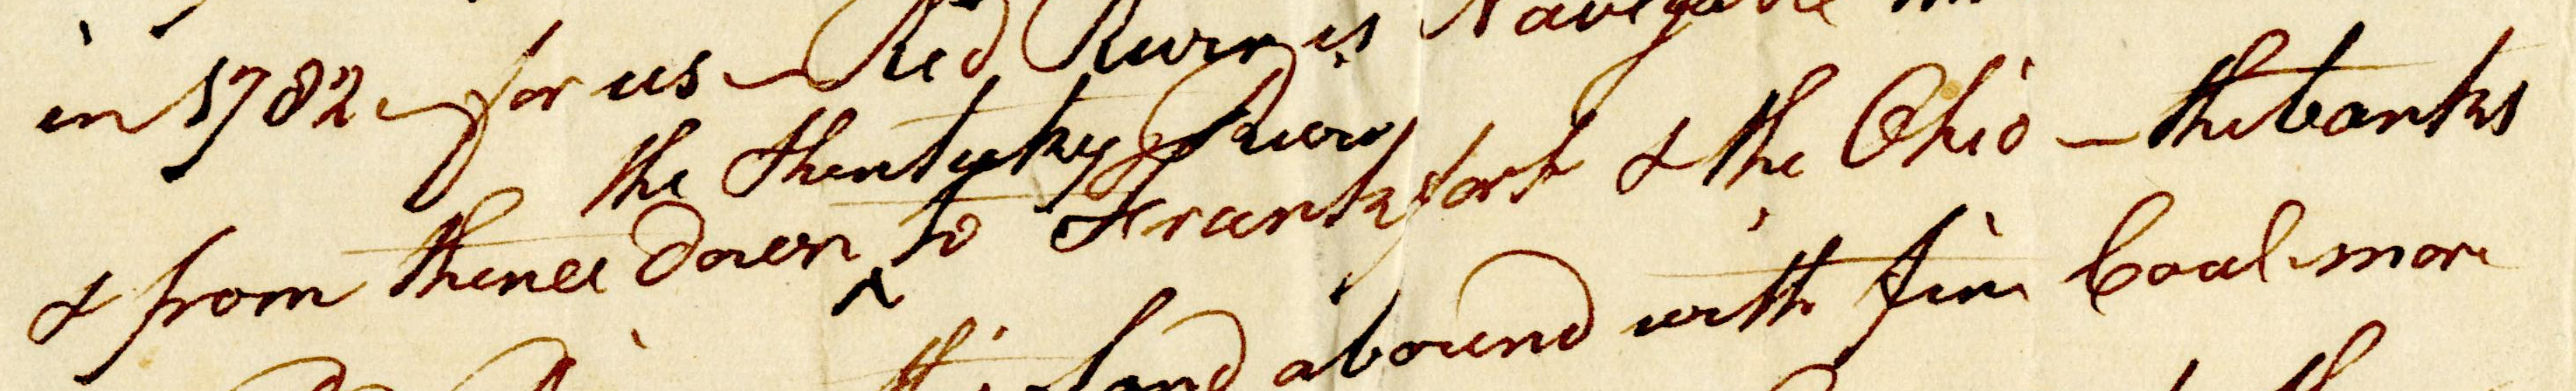& from thence down ^ to Frankfort & the Ohio- the banks
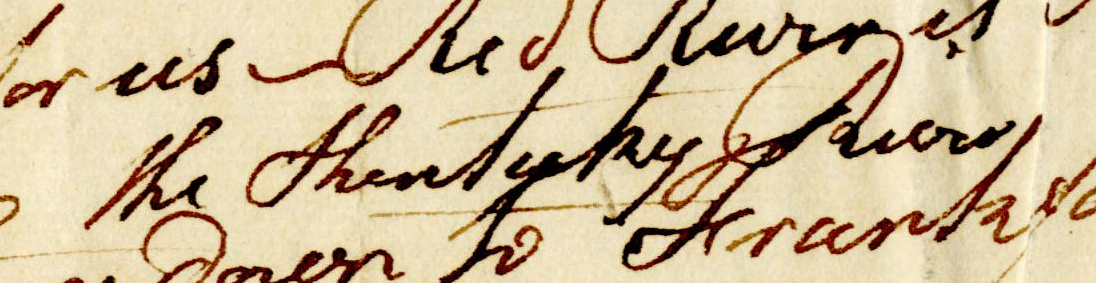the Kentucky River
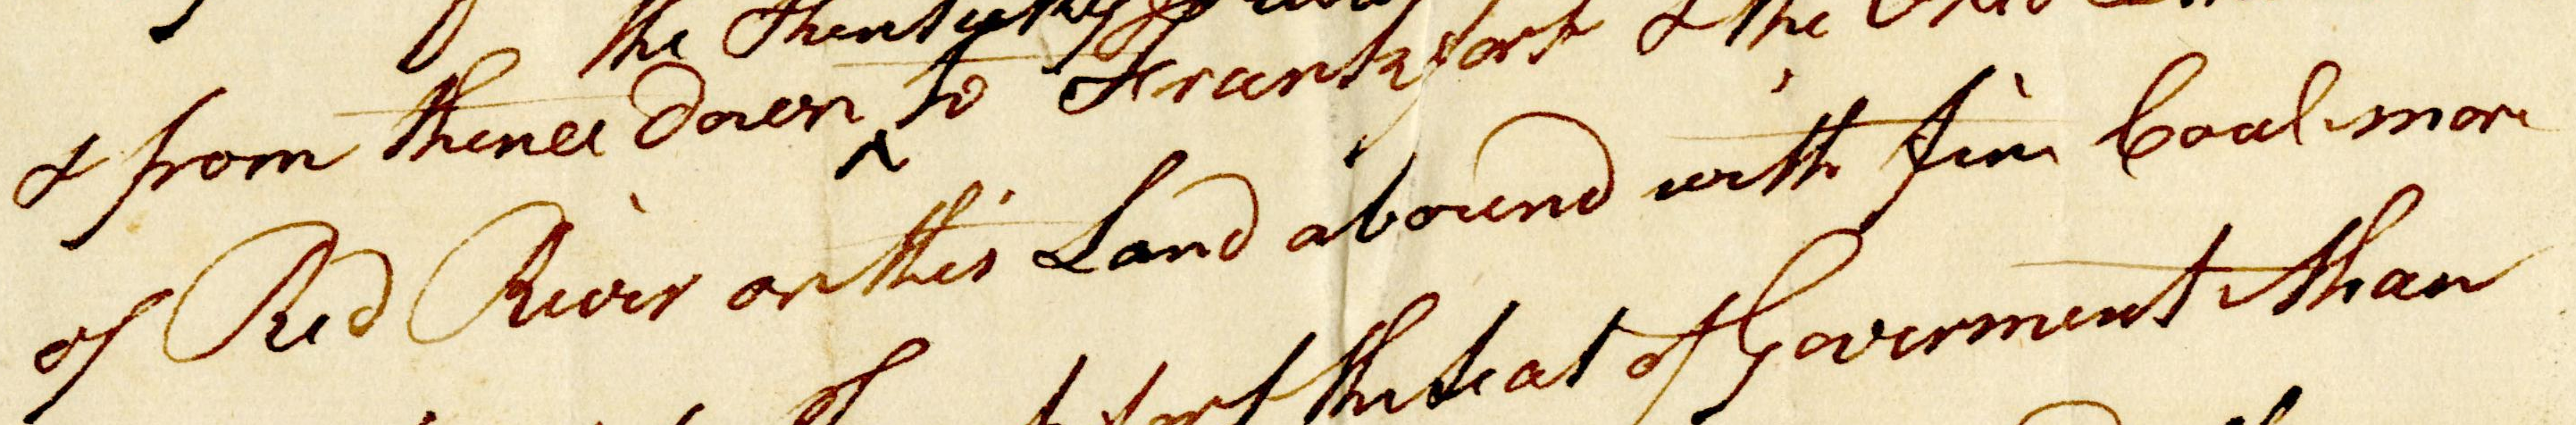of Red River on this land abound with fine Coal more
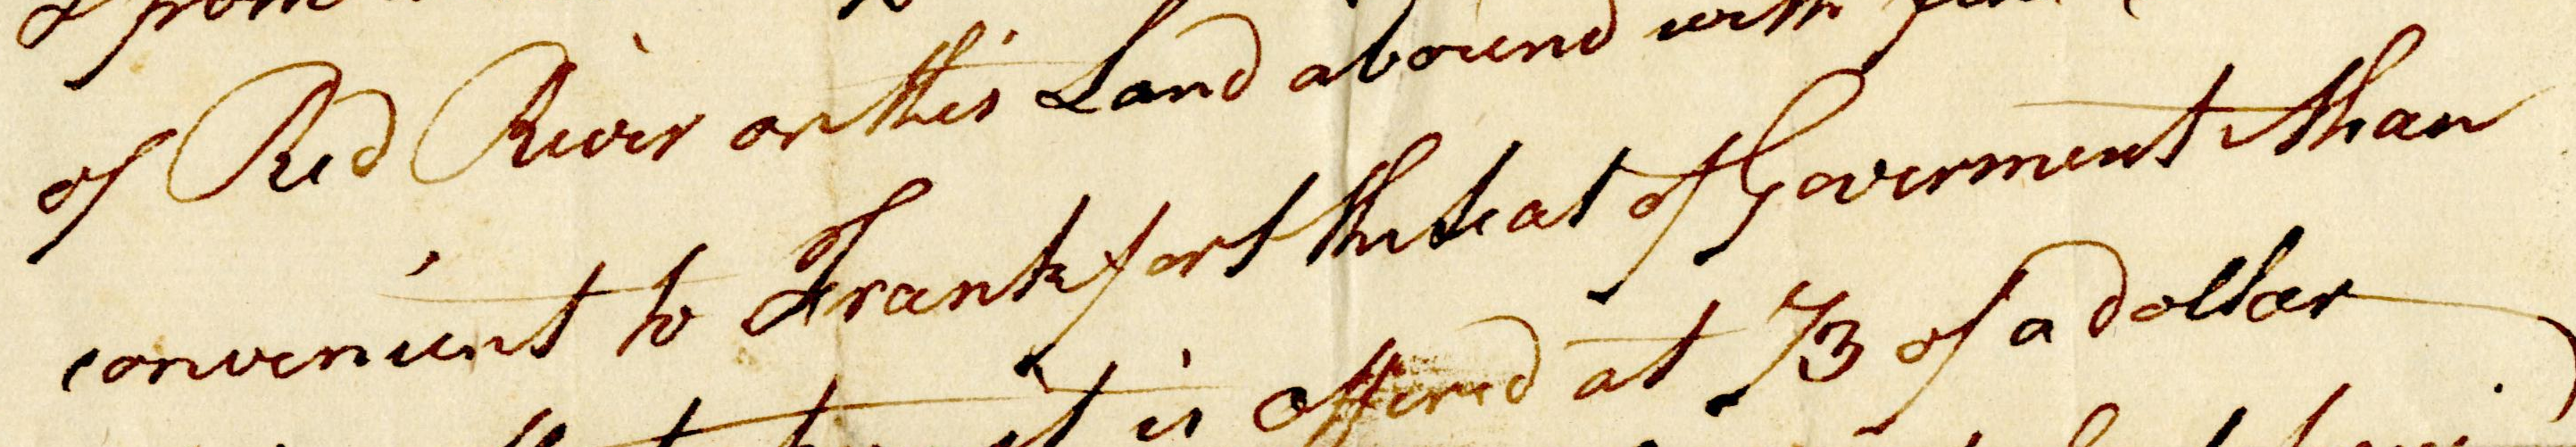convenient to Frankfort the Seat of Government than
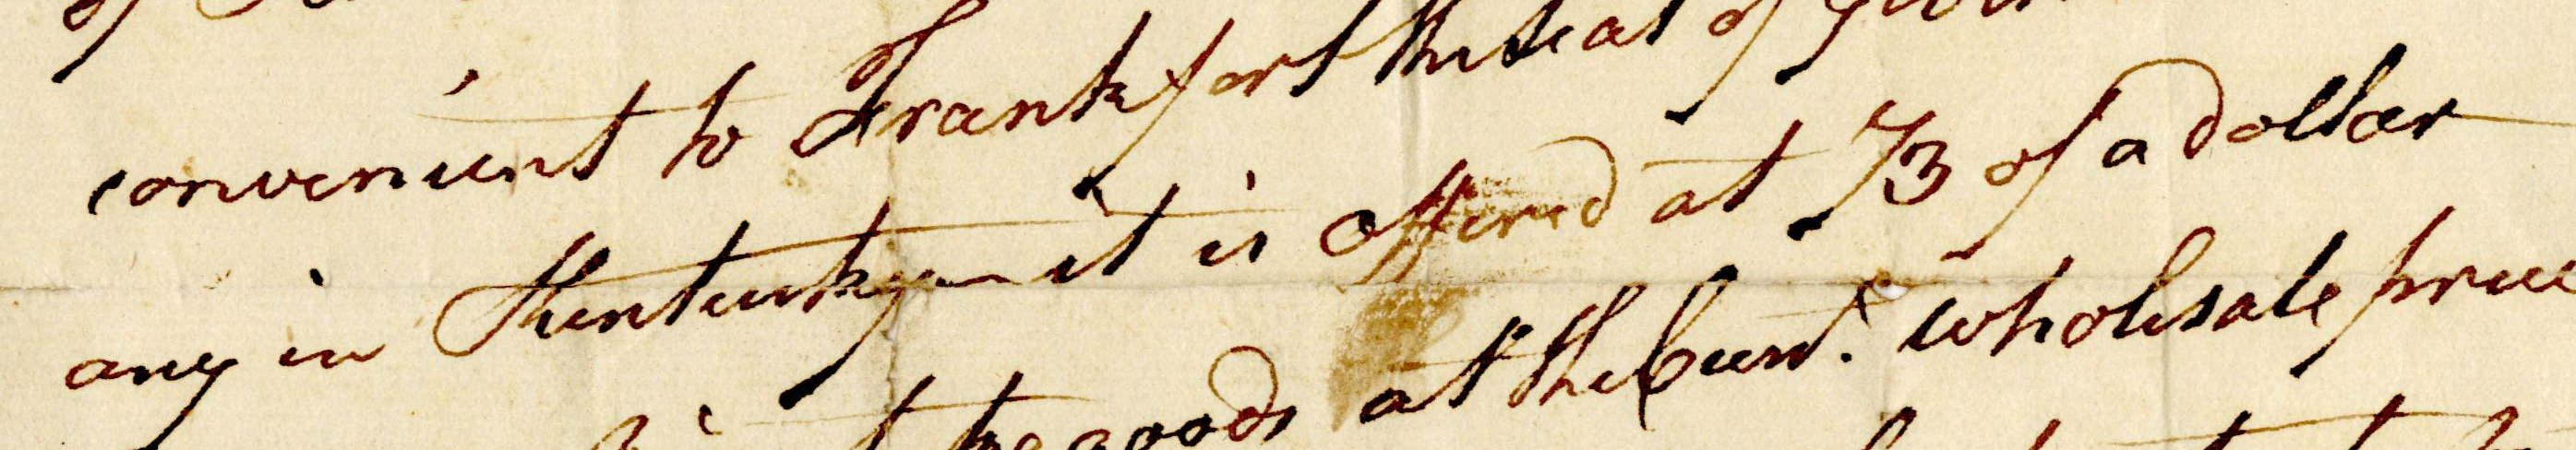any in Kentucky it is offerd at 73 of a dollar
